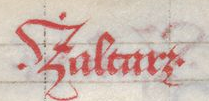.Żaltarz.
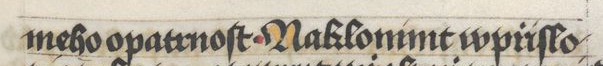meho opatrnoſt.Naklonímt w pṙiſlo¬
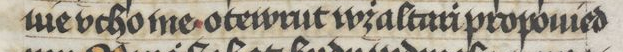uíe vcho me.otewrut wżaltaṙi propouied
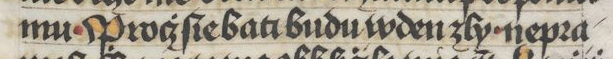mu.Procż ſie bati budu wden zly.nepra¬
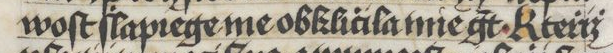woſt ẛlapiege me obkliċila mie ḡt.Kteṙíż
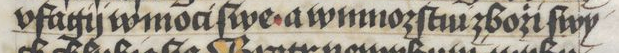vſagij w moci ſwe.a w mnozſtui zbożí ſwy¬
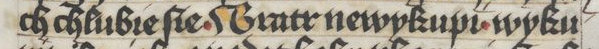ch chlubíe ſie.Bratr newykupí.wyku¬
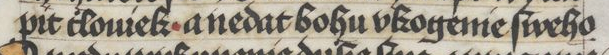pít ċlouíek.a nedat bohu vkogeníe ſweho
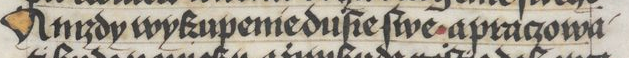A mzdy wykupeníe duẛie ſwe.a praczowa¬
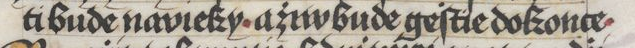ti bude navieky.a żiw bude geẛtie dokonce.
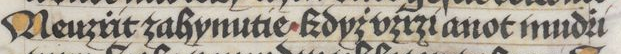Neuzṙít zahynutie.když vzrzí anot mudṙí
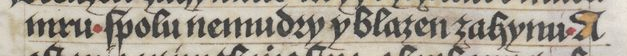mru.ſpolu nemudry y blazen zahynu.A
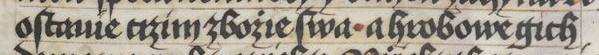oſtauie cizím zbożie ſwa.a hrobowe gich
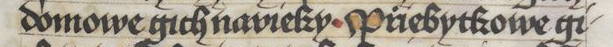domowe gich navieky.Pṙiebytkowe gí¬
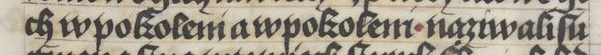ch w pokolení a w pokolení.naziwali ſu
